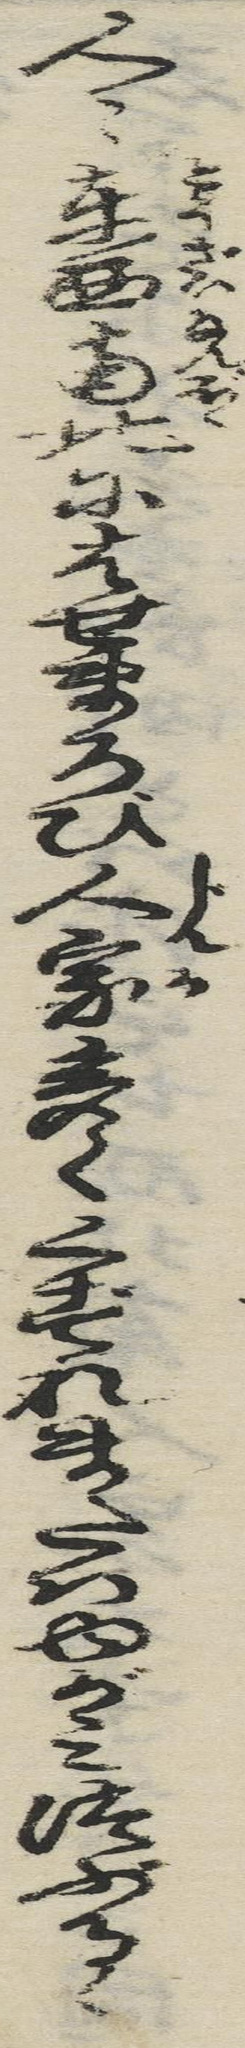人々東西南北にはせまろび人家多くくずれまたはゆがみつぶるゝ
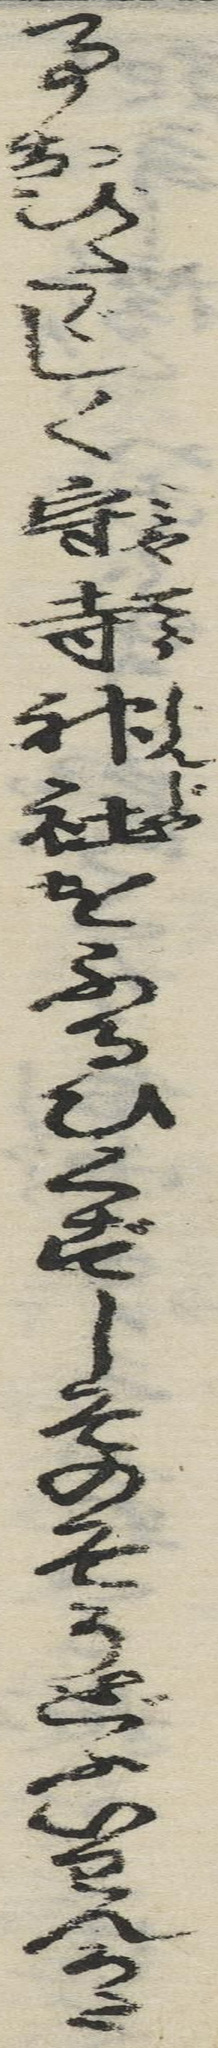事おびたゞしく守寺神社をふるひくずしそのそうどふいわんかた
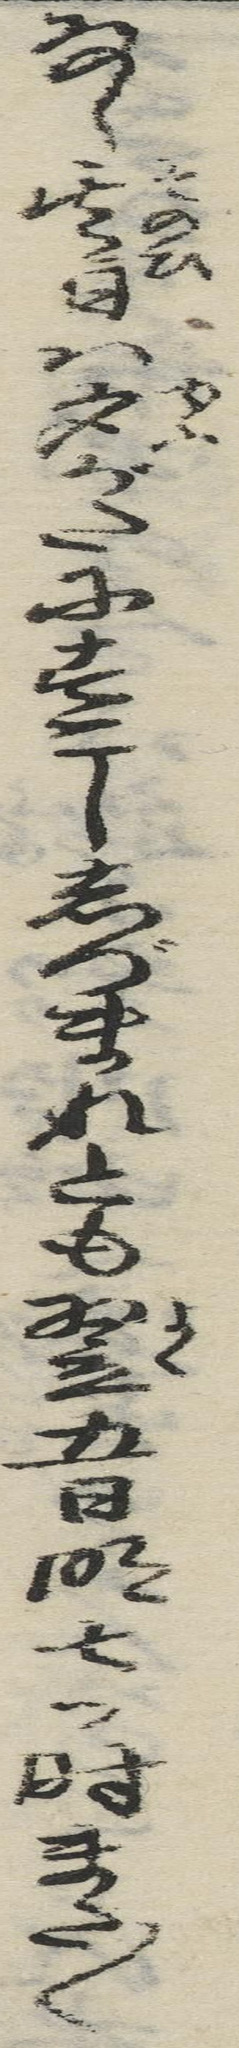なし其日は夕がたにすこししづまれとも翌五日明七ッ時また〳〵
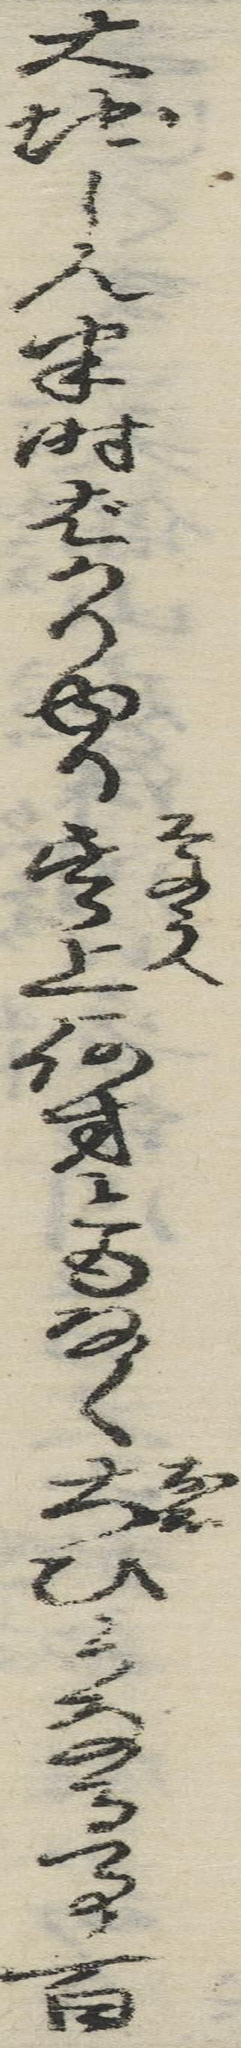大地しん半時ばかりゆり其上何方ともなく大ひになる事百
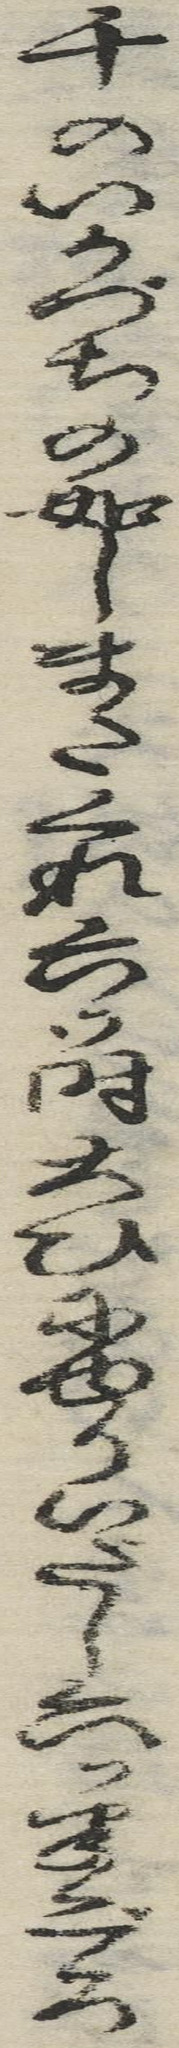千のいかづちの如しまたくれ六ツ時大ひにゆりいだし六ッ半ごろ

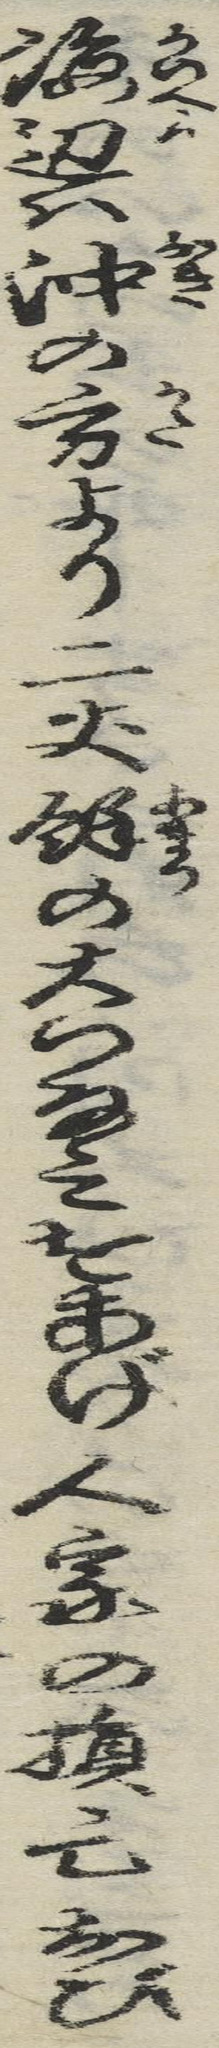海辺は沖の方より二丈餘の大つなみをあげ人家の損亡おび
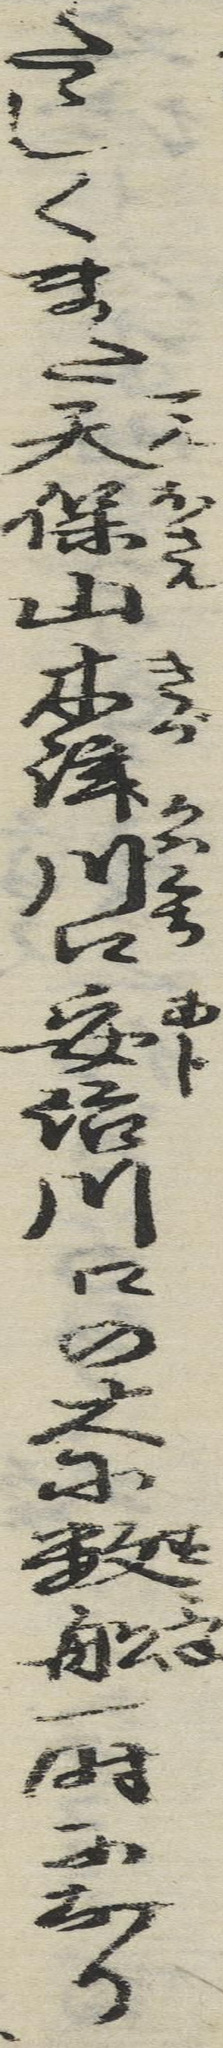たゝしくまた天保山木津川口安治川口の大に数船一時におり
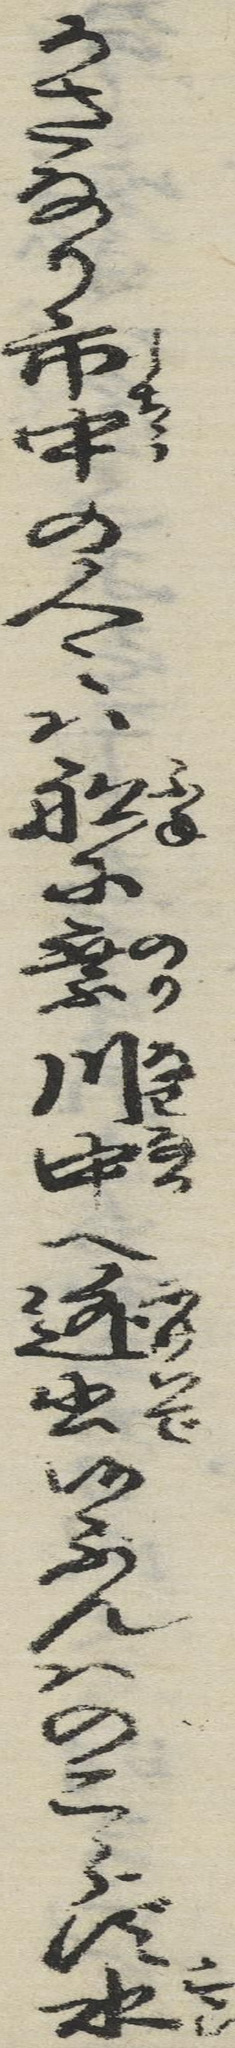かさなり市中の人ヽは船に乗川中へ逃出候ふんはのこらず水
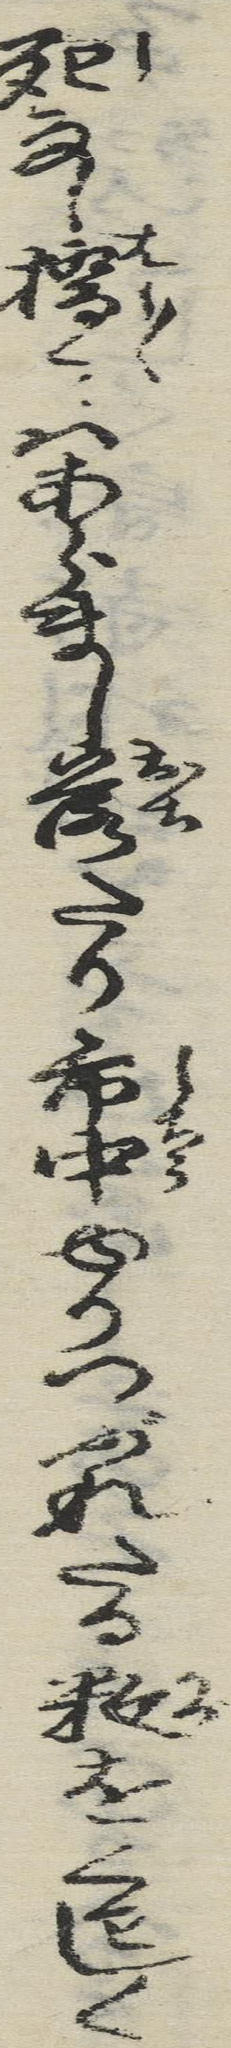死なし橋〳〵はあらまし落たり市中ゆりつぶれたる数をくわしく
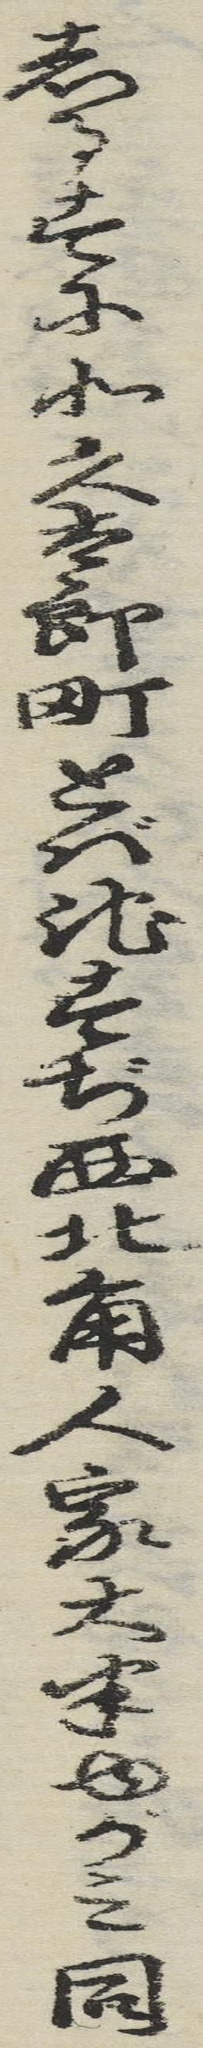しるすに北久太郎町とバ池すぢ西北角人家大半ゆがみ同
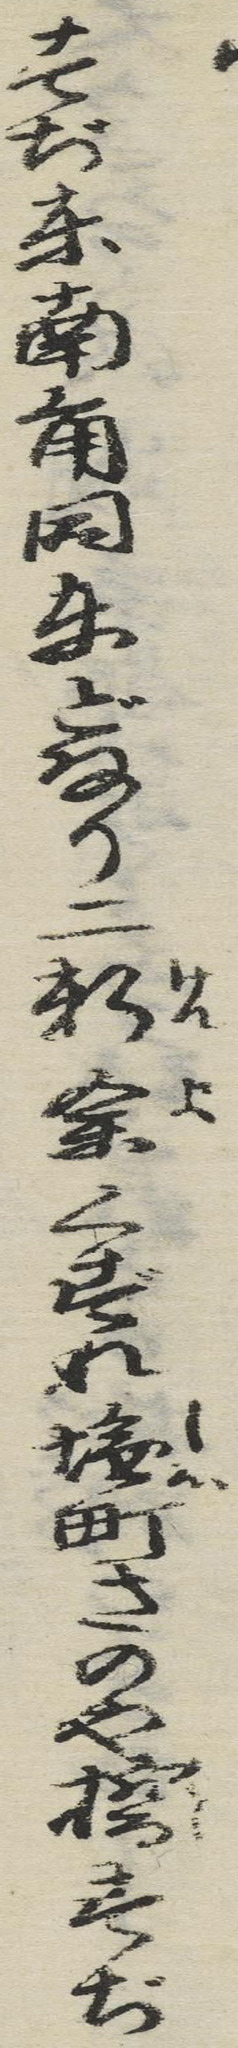すぢ東南角同東どなり二軒余くずれ塩町さのや橋すぢ
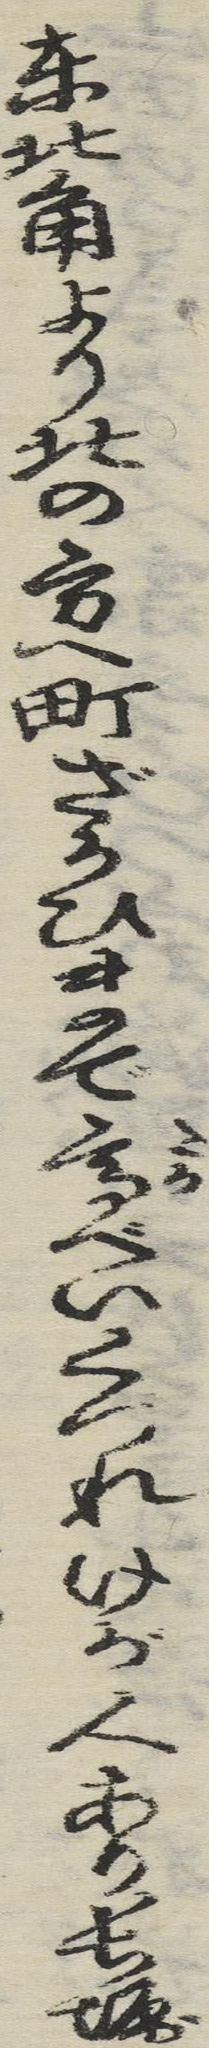東北角より北の方へ町ざかひまで高べいくづれけが人あり長堀
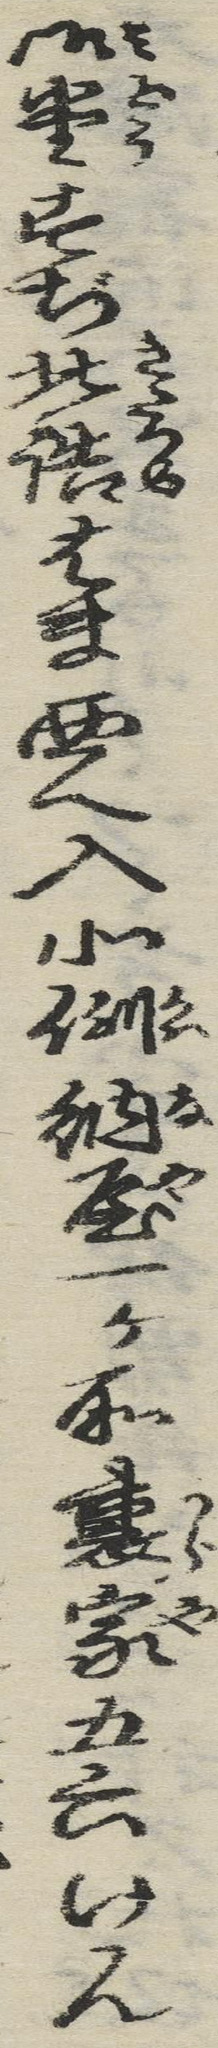御堂すぢ北詰はま西へ入北側納屋一ヶ所裏家五六けん
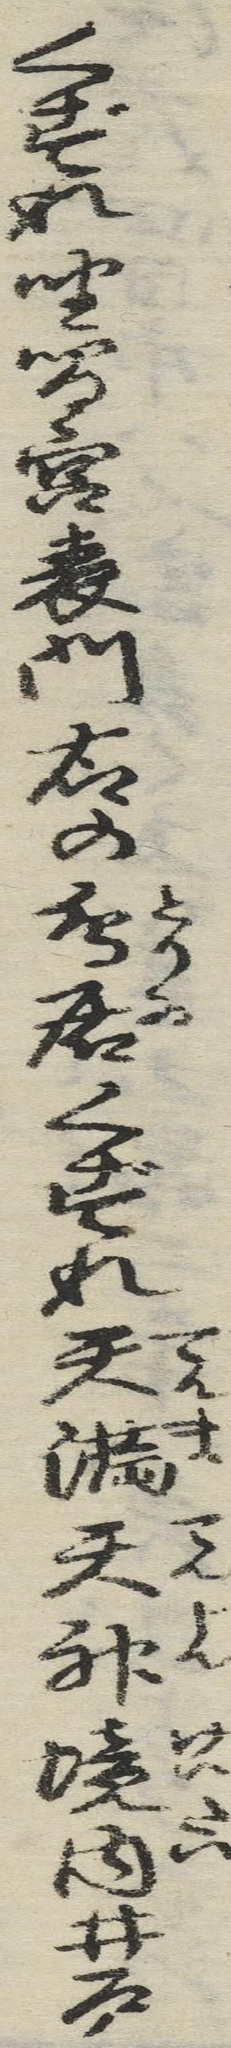くずれ坐間宮表門右の鳥居くずれ天満天神境内井戸
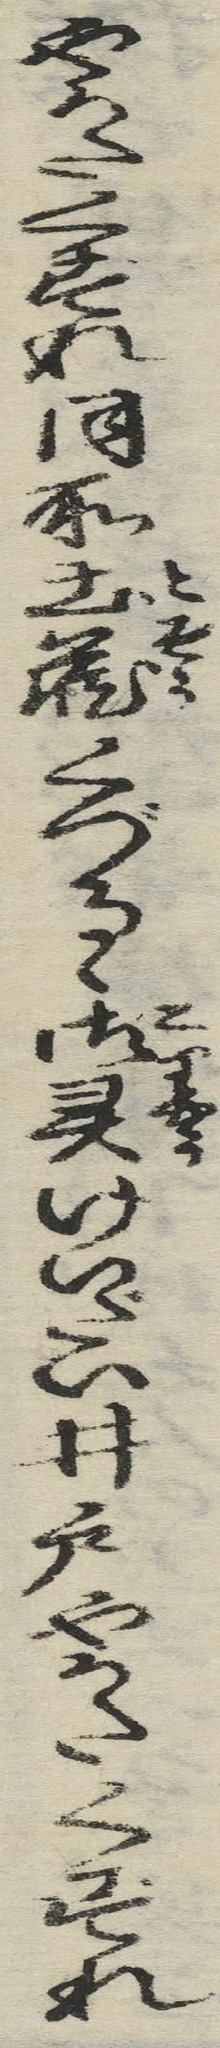やかたくずれ同所土蔵くづるゝ御霊けいだい井戸やかたくずれ
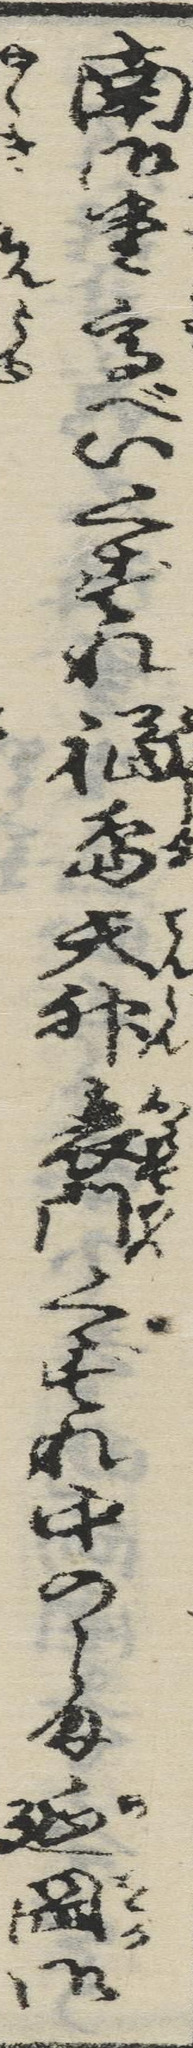南御堂高べいくずれ福島天神表門くずれ中のしま延岡御
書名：諸国海辺地震津波書
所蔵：東京大学地震研究所図書室 Earthquake Research Institute Library, The University of Tokyo, JAPAN
